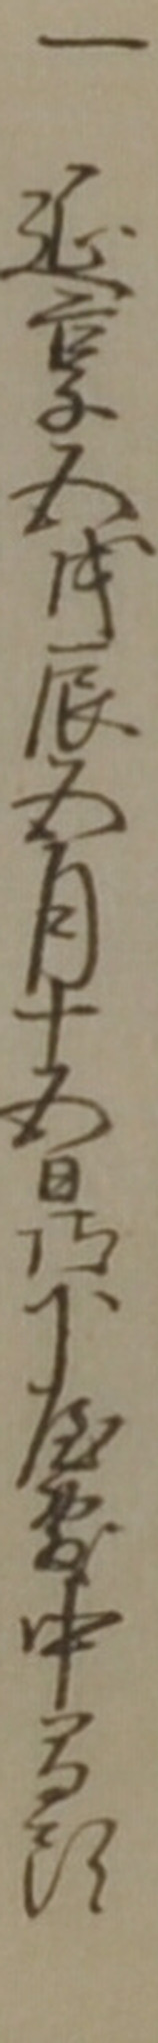一延享五戊辰五月十五日御下屋敷中間頭
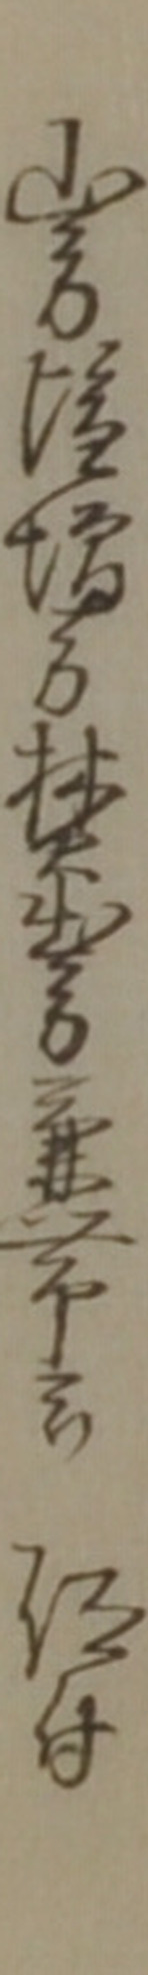山方塩増方焚出方兼帯被仰付
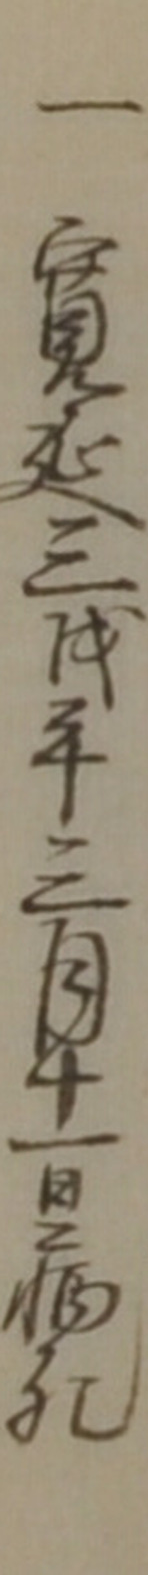一寛延三戊午三月十一日病死
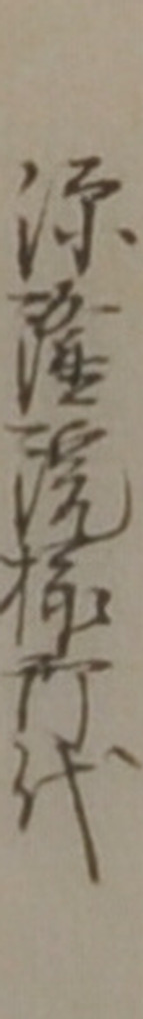源隆院様御代
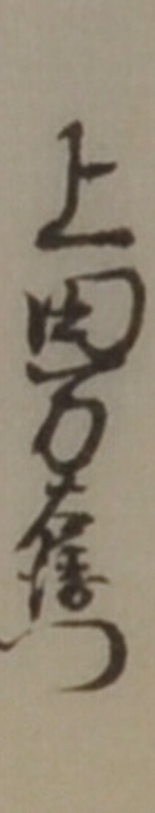上田万右衛門
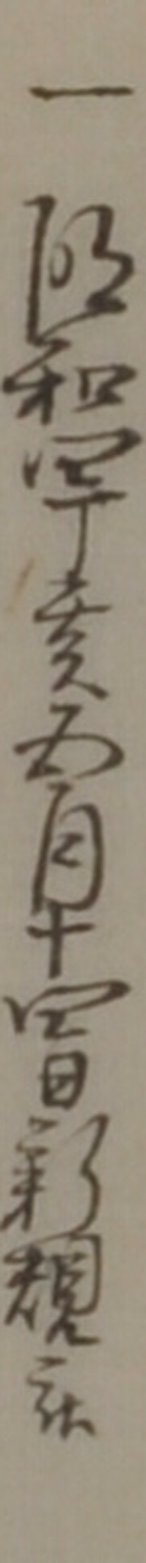一明和四丁亥五月十四日新規被
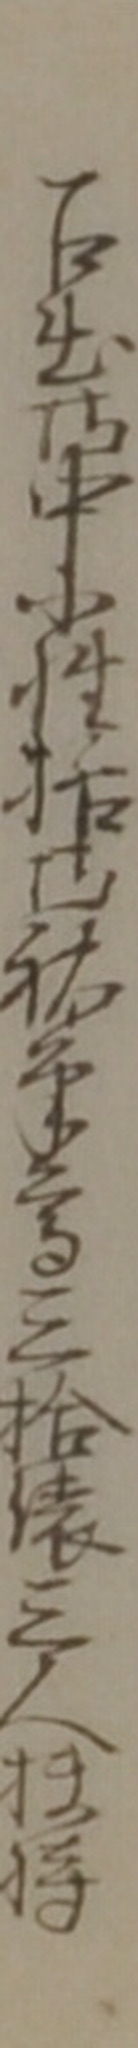召出御中小性格御祐筆高三拾俵三人扶持
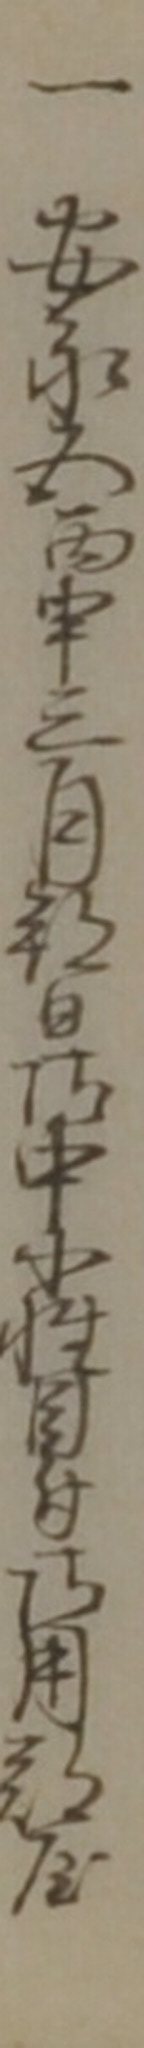一安永五丙申三月朔日御中小性目付御用部屋
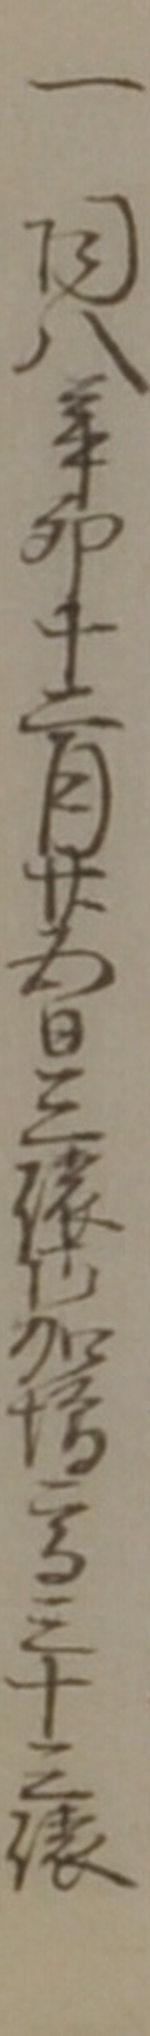一同八辛卯十二月廿五日三俵御加増高三十三俵
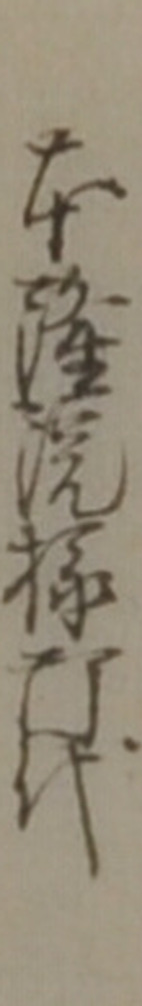本隆院様御代
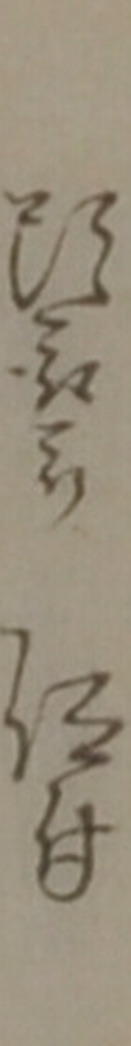頭取被仰付
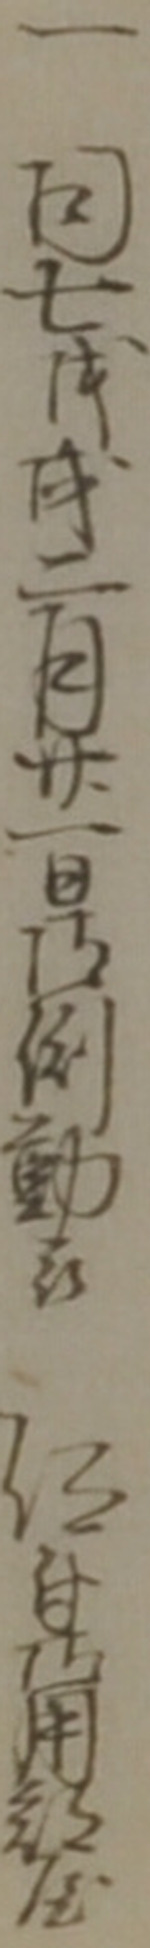一同七戊戌二月廿一日御側勤被仰付御用部屋
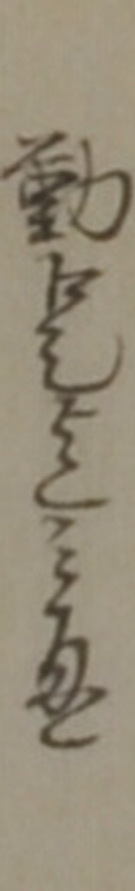勤是迄之通
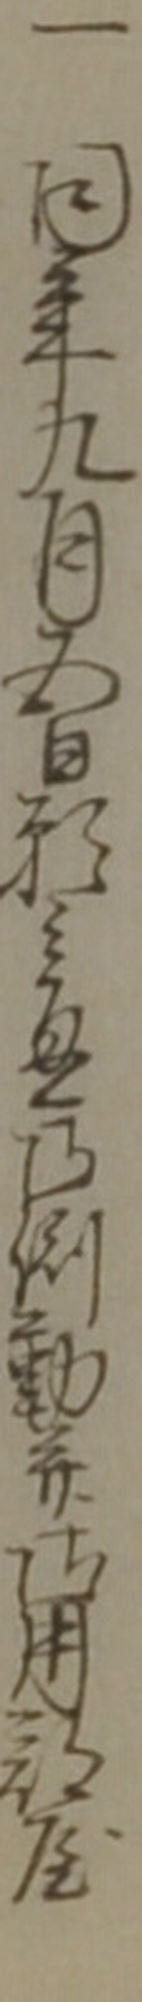一同年九月五日願之通御側勤并御用部屋
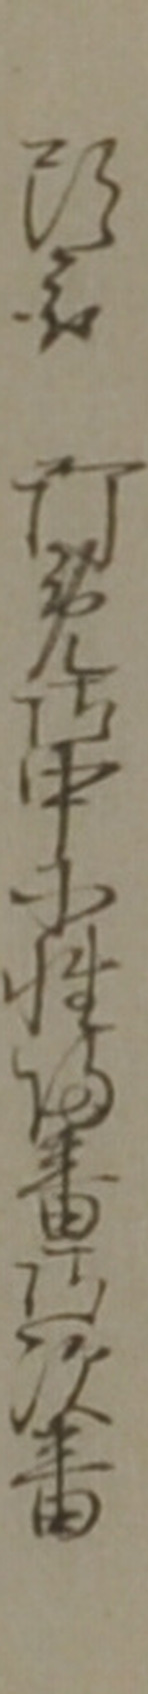頭取御免御中小性帰番御次番
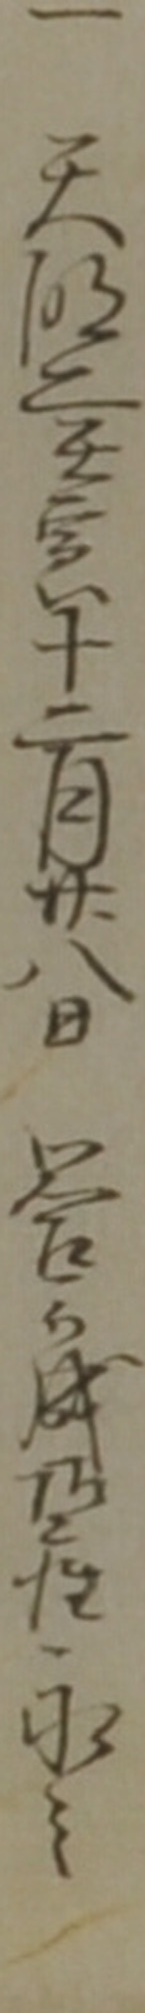一天明二壬寅十二月廿八日思召被成御座永之
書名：無足廃家（壱）
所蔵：伊那市立高遠町図書館・合同会社AMANE
